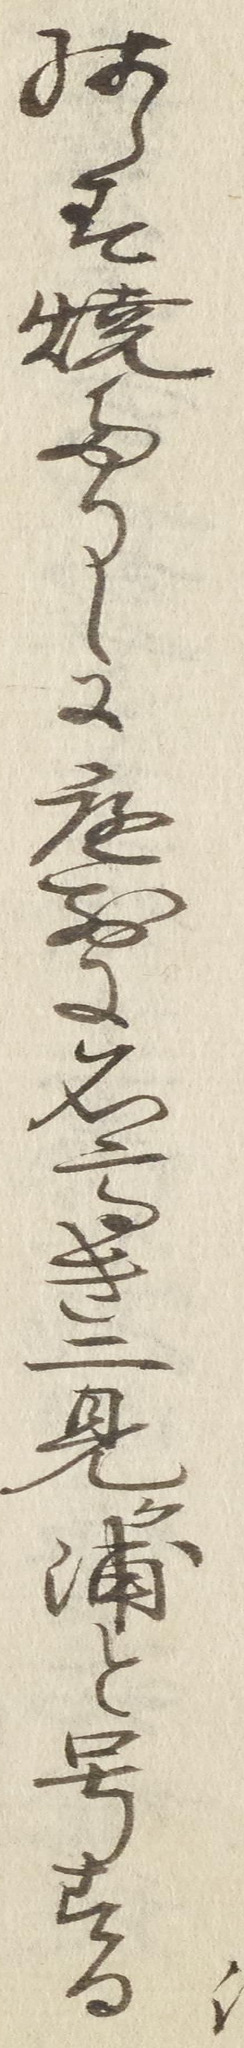残らす焼たりしに庭前に名高き二見ヶ浦と号する
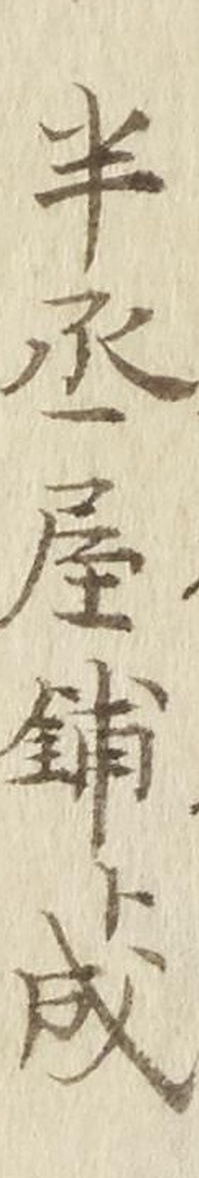半丞家鋪と成
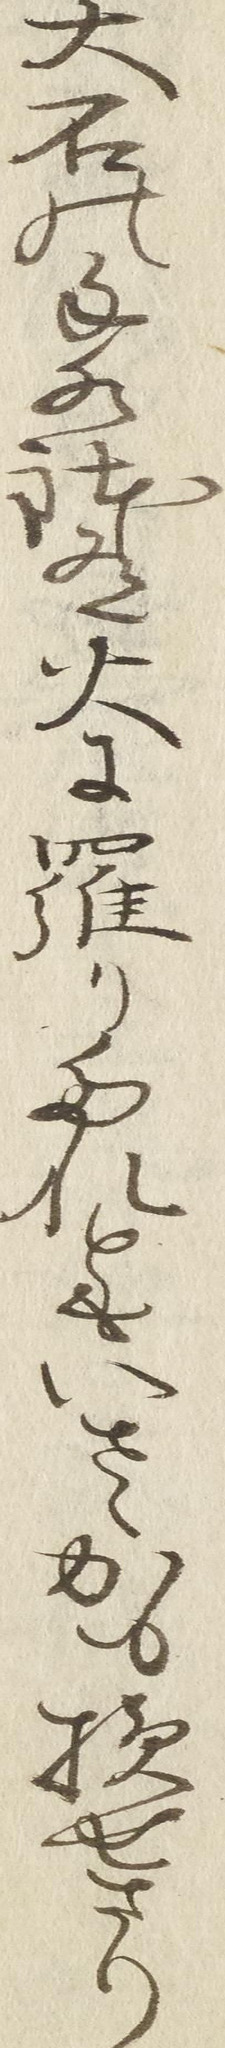大石の手水鉢有火に罹りたれともいさゝかも損せさり
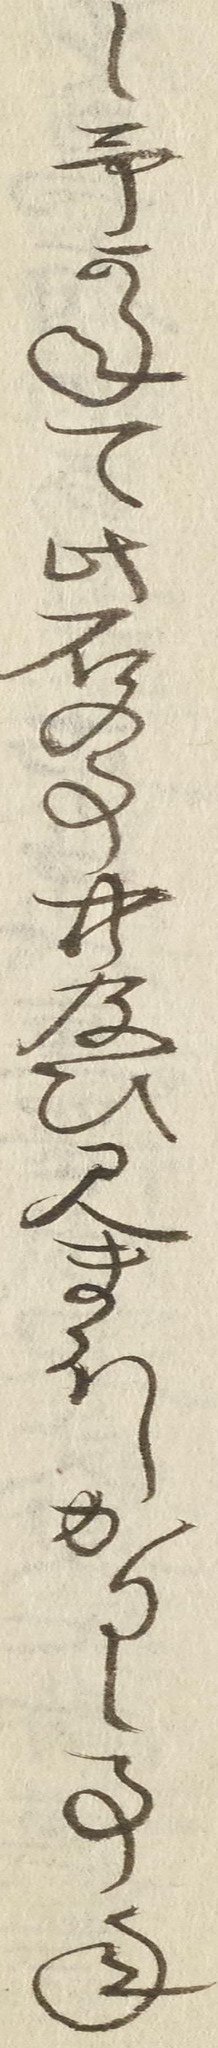し予かねて此石の事聞及ひ見まほしかりし事年
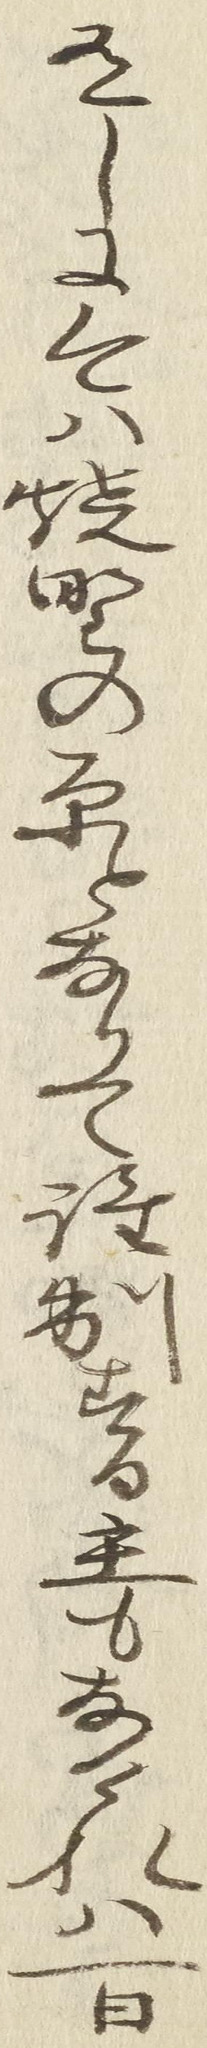有しに今は焼野の原となりて踵制する主もなけれは一日
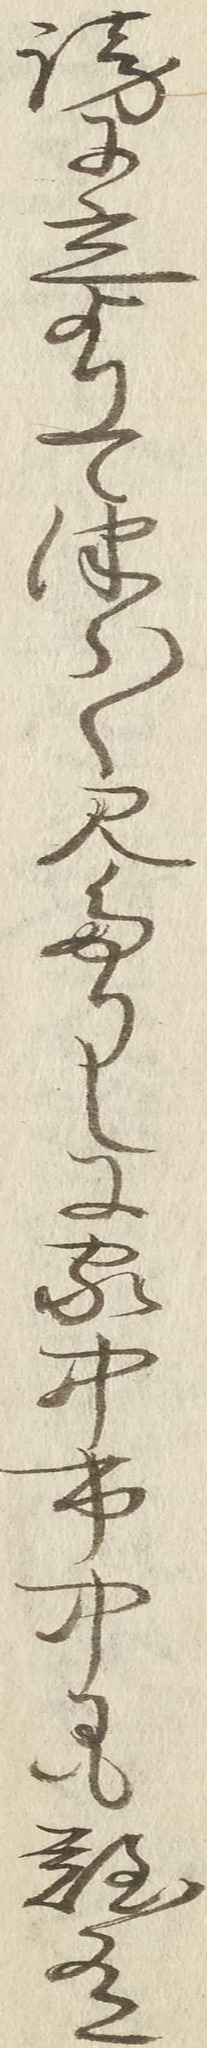傍に立よりてつら〳〵見たりしに家中市中にも難有
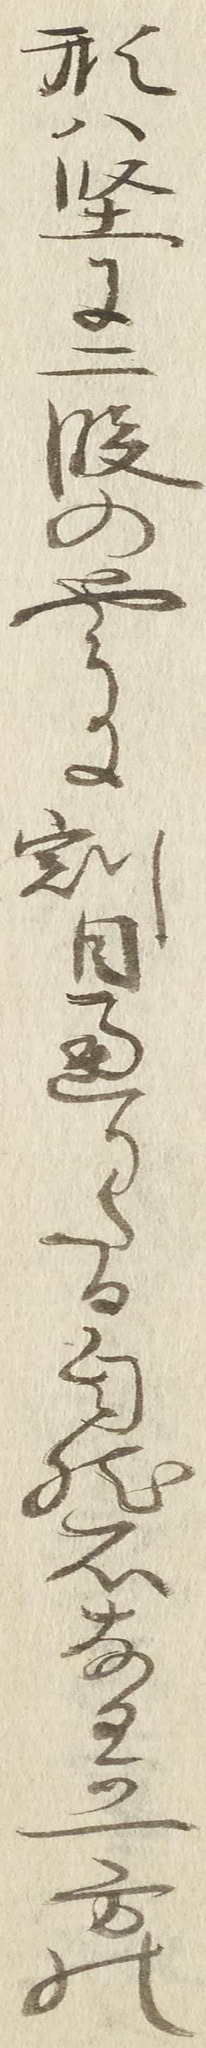形は堅に二段のやうに割目通りたる自然石なるか一方の
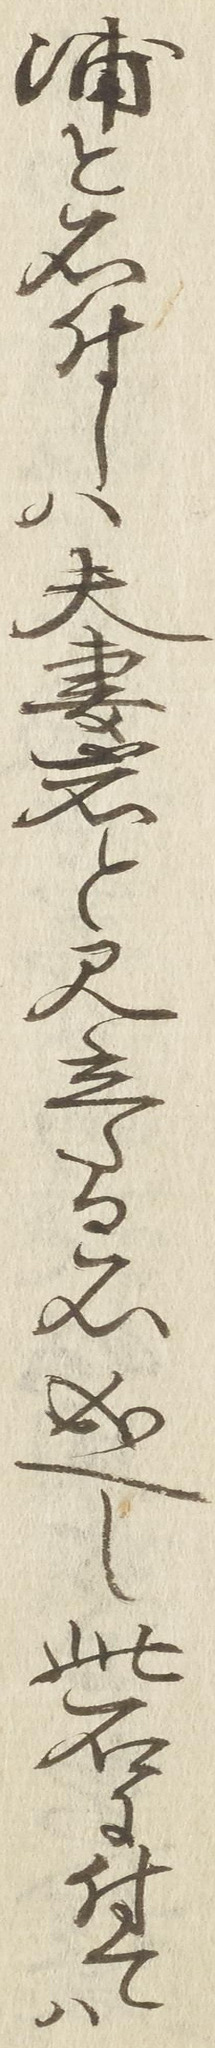浦と名付しは夫妻岩と見立たる名成へし此石に付ては
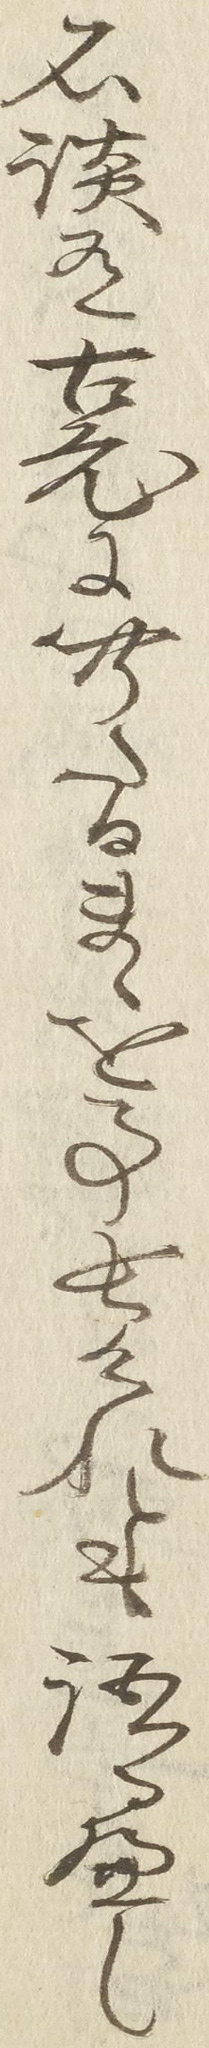名談有古老に聞たるまゝを事長けれとも語るへし
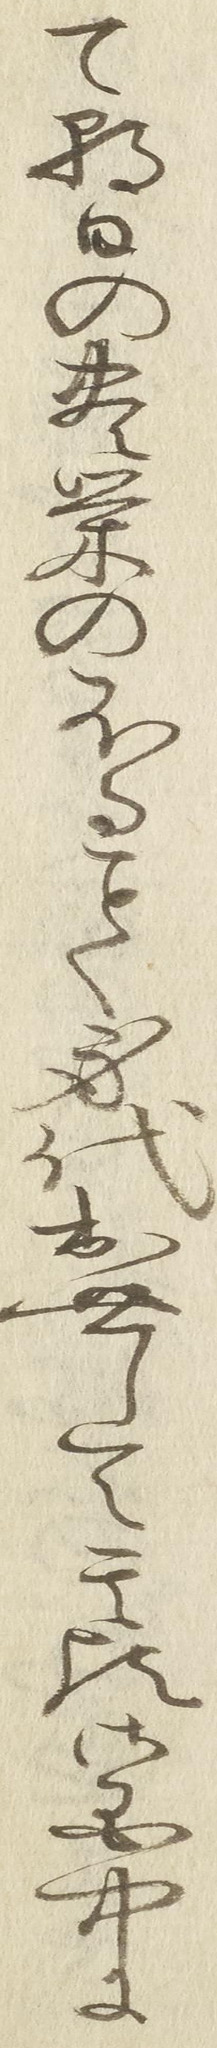て朝日の豊栄のほることく身代出世して其頃御国中に
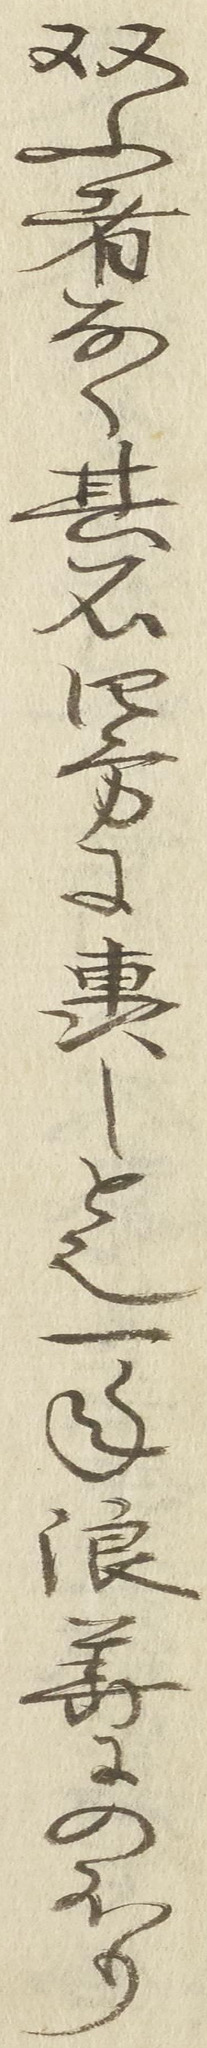双ふ者なく其名四方に轟しと也一手浪算にのほり

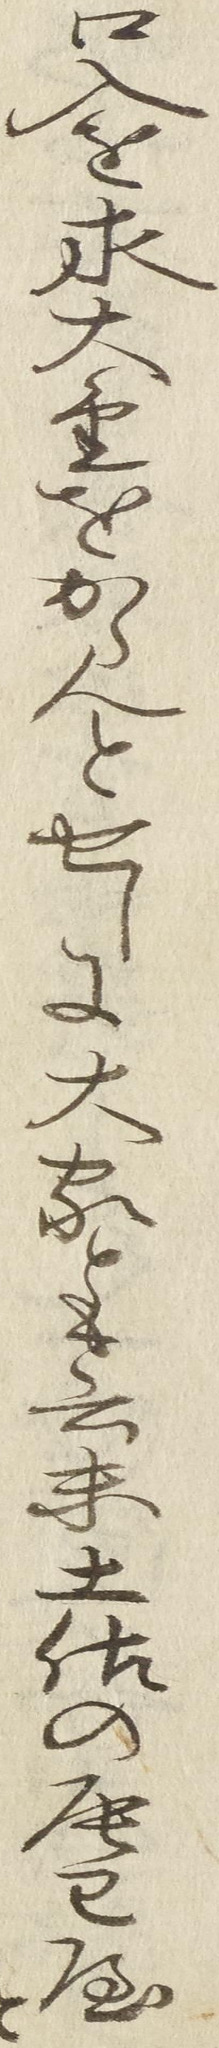口入を求大金をからんとせしに大家とも云末土佐の辰巳屋と
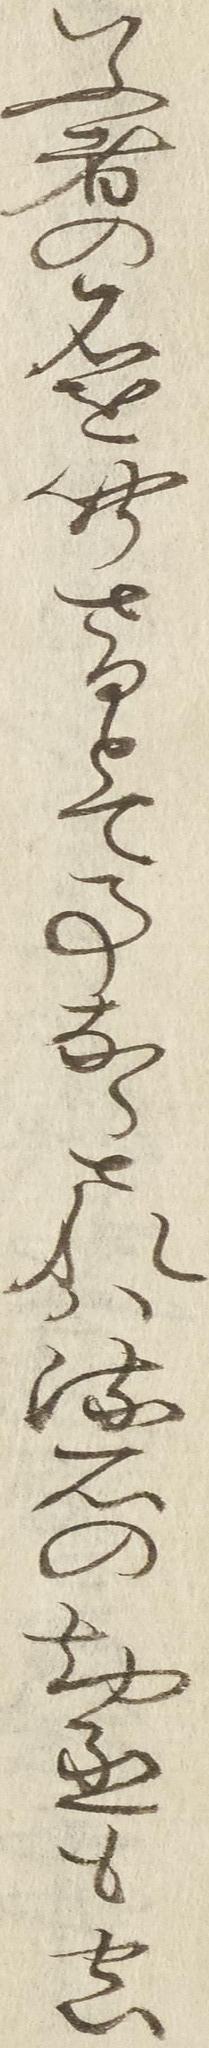いふ者の名を聞さるとて事なりされは流石の勘丞も空
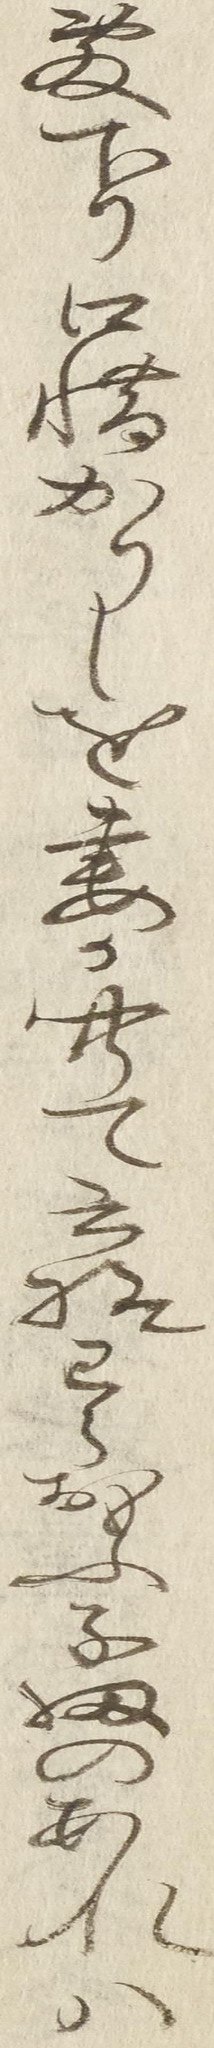敷下り口惜かりしを妻か聞て云給わらおもふ子細のあれは
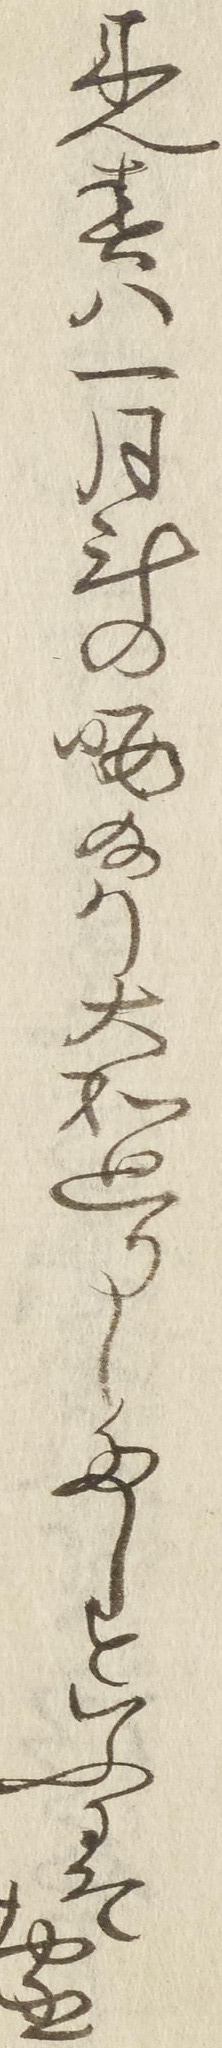来春は一月斗の暇為り大和廻りしたしといふにて勘丞
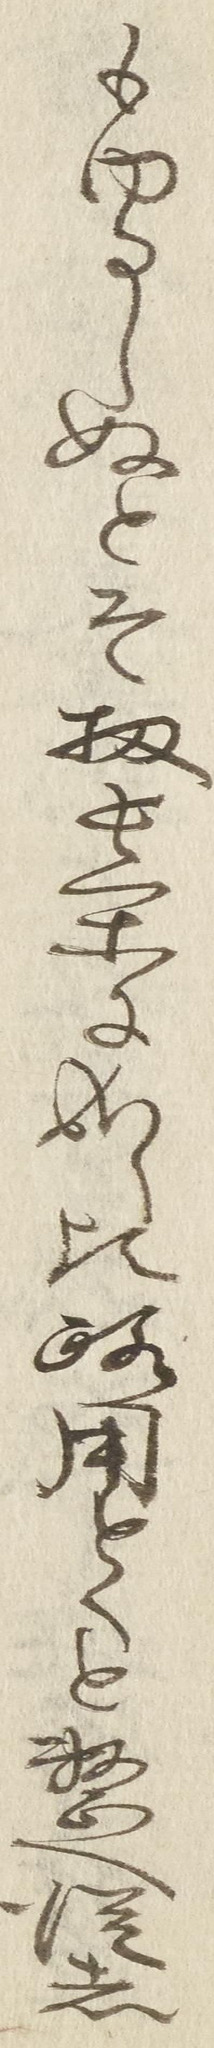もゆるしぬとそ扨長閑に成し頃路用とくと整へ従者
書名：地震記　上
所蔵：東京大学地震研究所図書室 Earthquake Research Institute Library, The University of Tokyo, JAPAN
